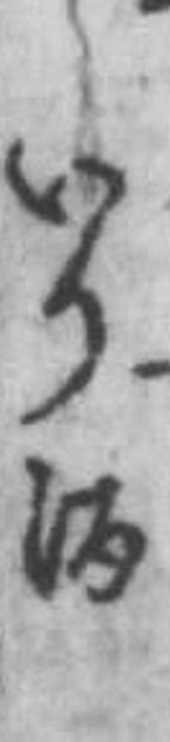いり酒

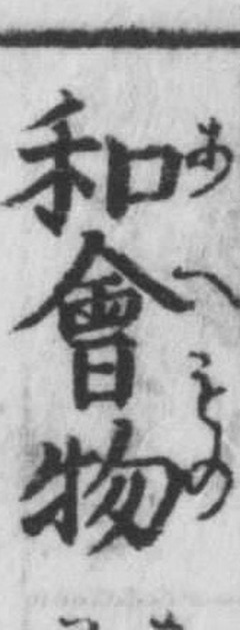和會物
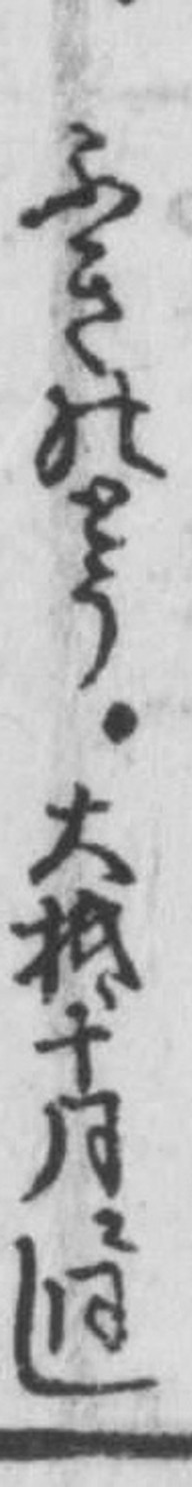ふきのとう大抵十月ニ同じ
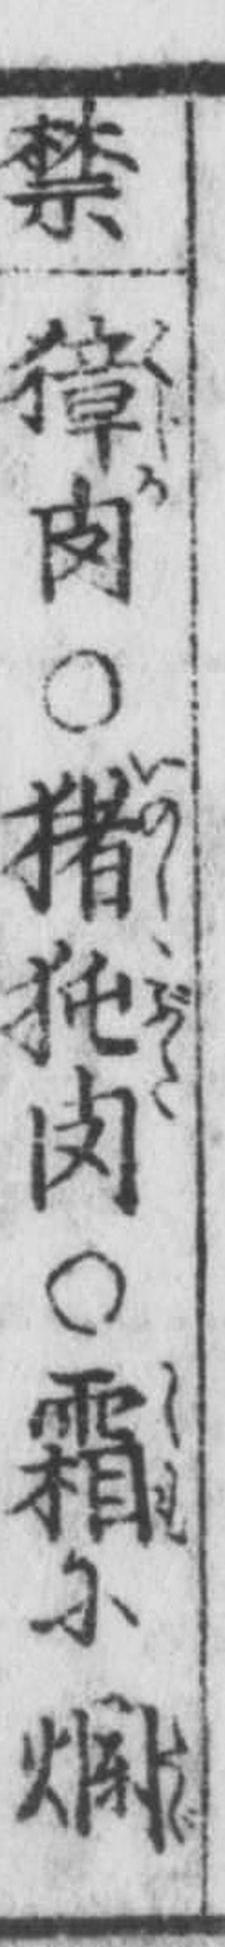禁獐肉〇猪豚肉〇霜に爛
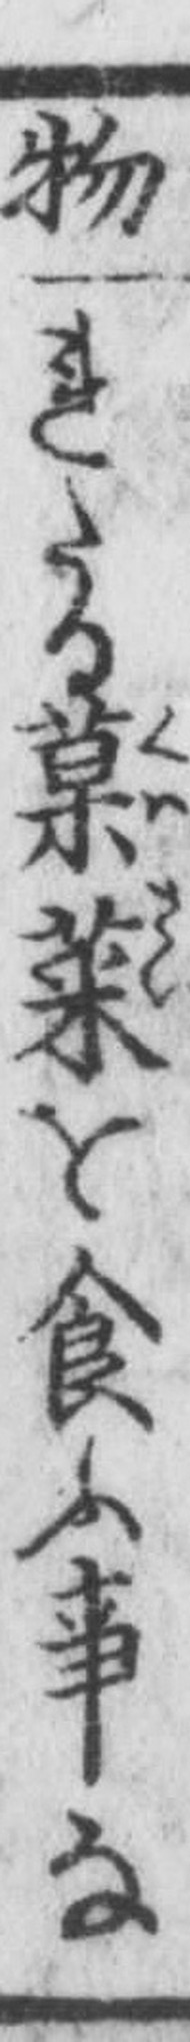物れたる菓菜食ふ事な
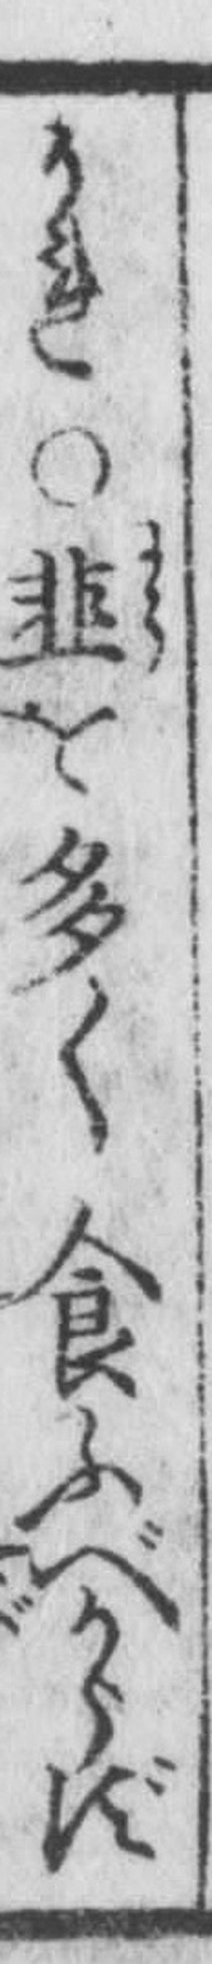かれ〇韮を多く食うふべからず
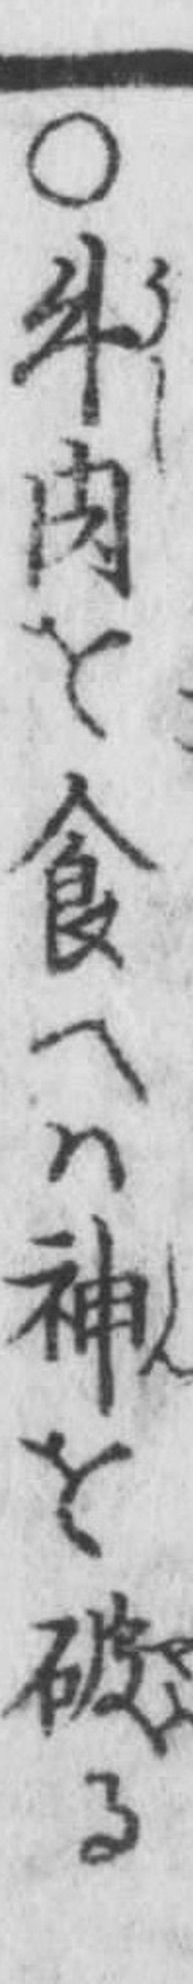〇牛肉を食へハ神を破る
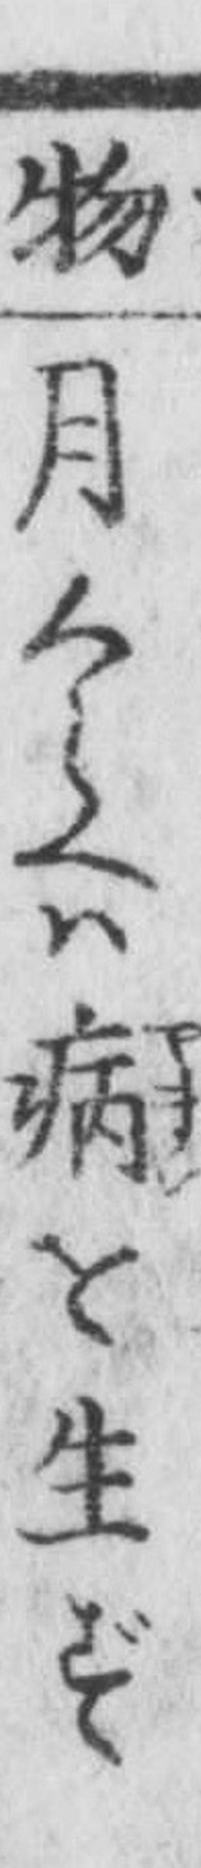物月くらへハ病を生ず
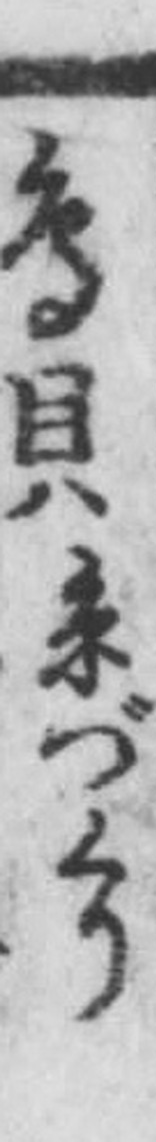鳥貝糸づくり

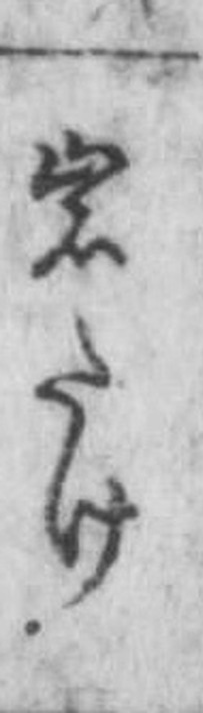岩たけ
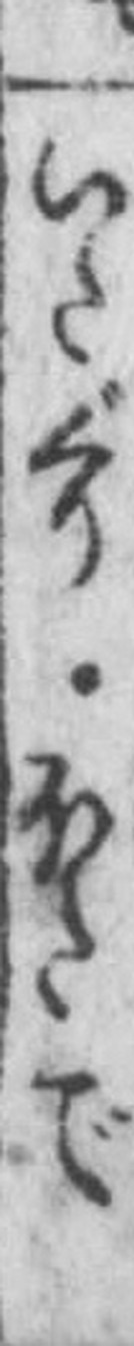いたぐりほたで
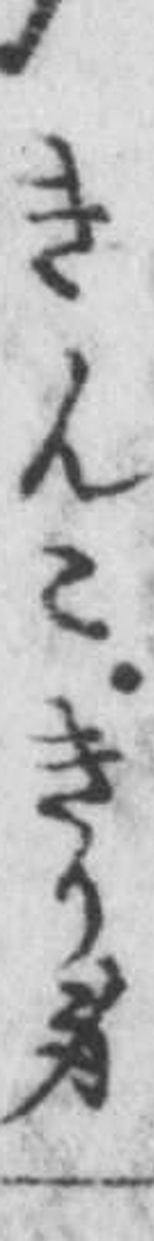きんこきり身鴨
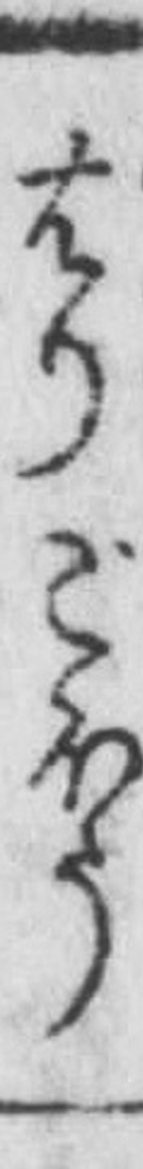はりごぼう
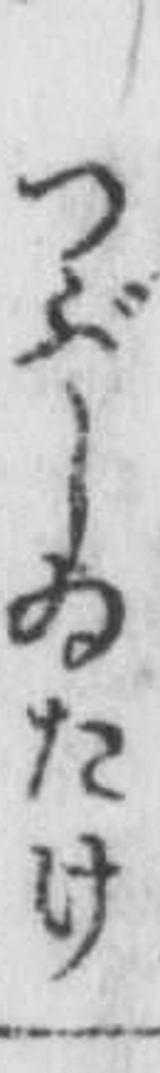汁つぶしいたけ
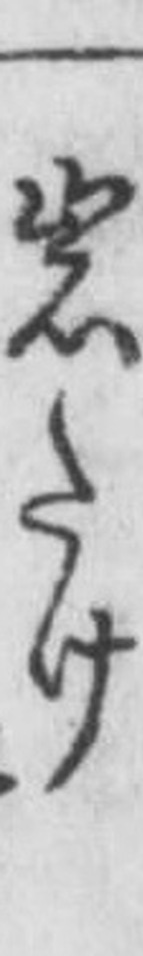岩たけ
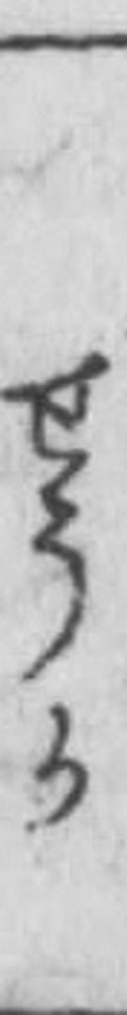せうか
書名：当世料理筌
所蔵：大阪府立大学学術情報センター 国文学研究資料館
